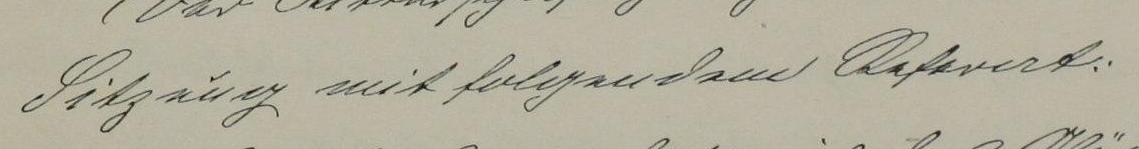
Sitzung mit folgendem Referat:
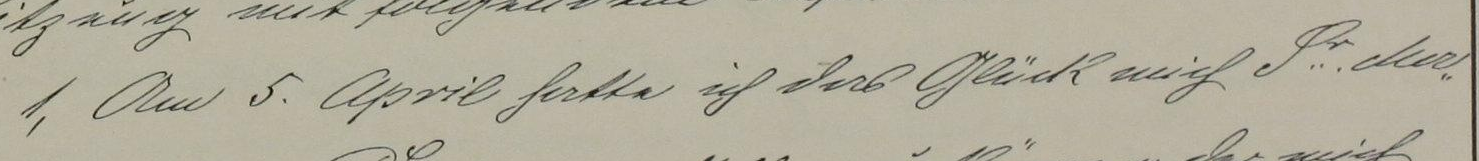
1. Am 5. April hatte ich das Glück mich Sr. Ma-
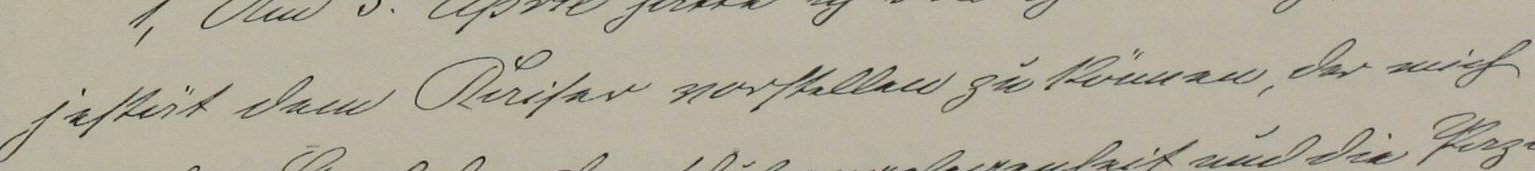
jestät dem Kaiser vorstellen zu können, der mich
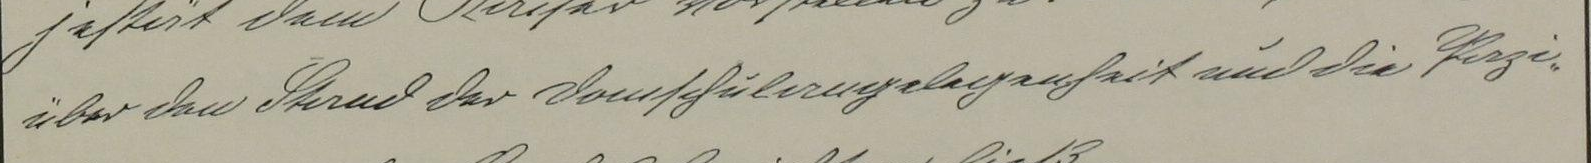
über den Stand der Domschulangelegenheit und die Pazi-
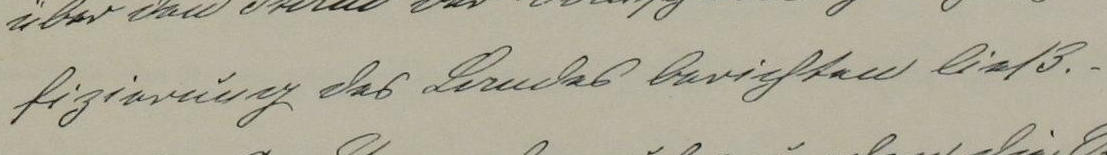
fizierung des Landes berichten ließ.
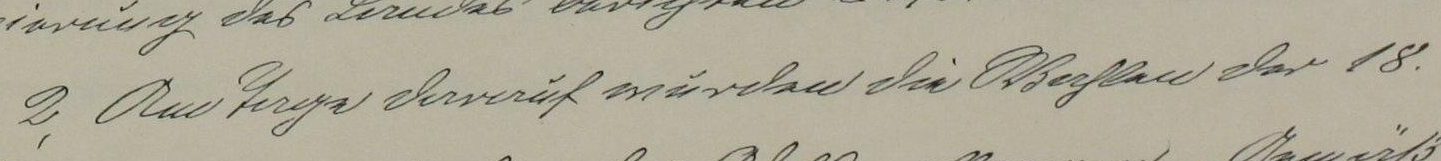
2. Am Tage darauf wurden die Wahlen der 18
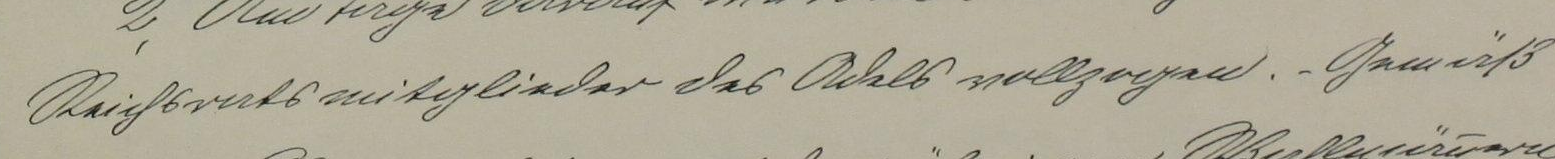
Reichsratsmitglieder des Adels vollzogen. Gemäß
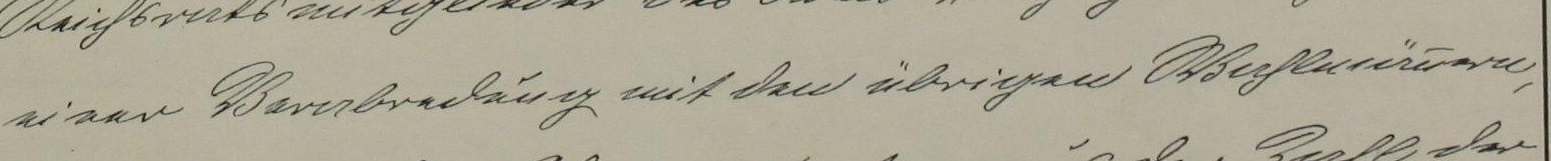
einer Verabredung mit den übrigen Wahlmännern,
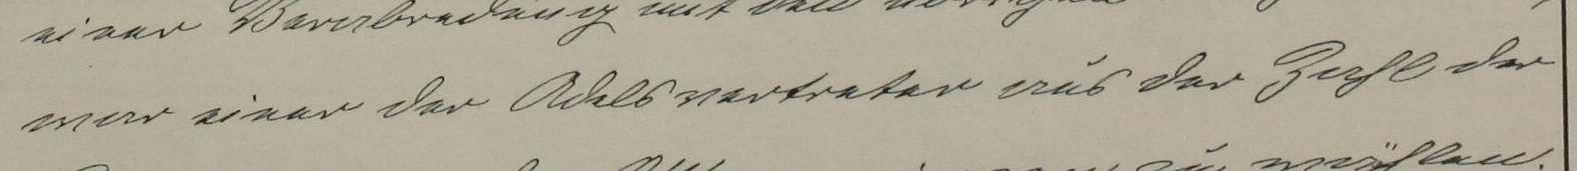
war einer der Adelsvertreter aus der Zahl der
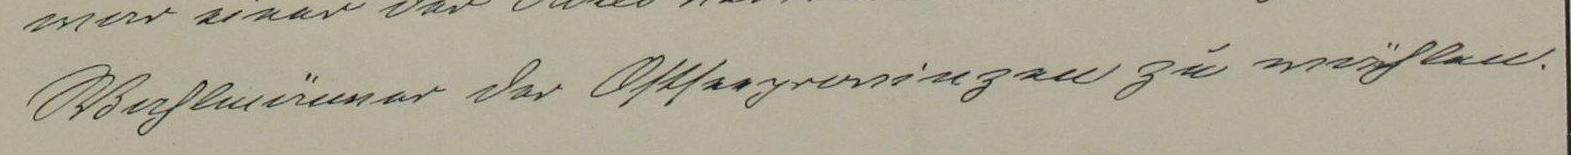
Wahlmänner der Ostseeprovinzen zu wählen.
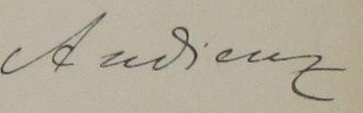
Audienz
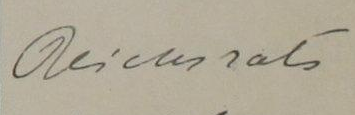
Richsrats
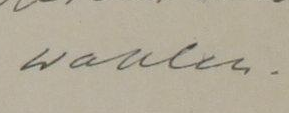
wahlen
